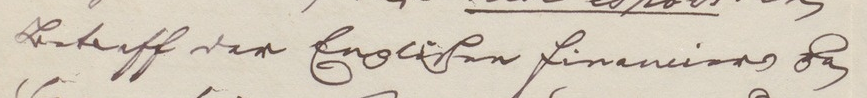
Betreff der Englischen Financiers zu
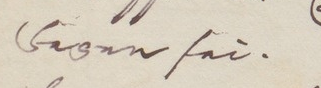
hegen sei.
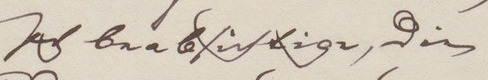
Ich beabsichtige, die
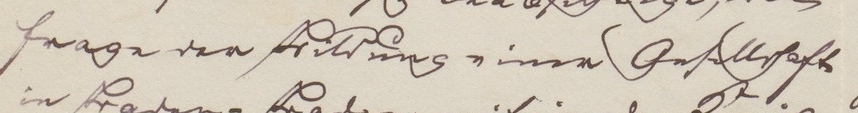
Frage der Bildung einer Gesellschaft
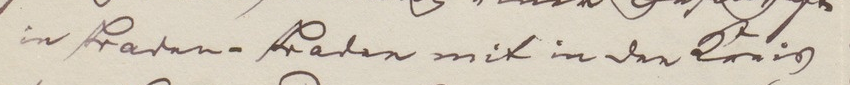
in Baden-Baden mit in den Kreis
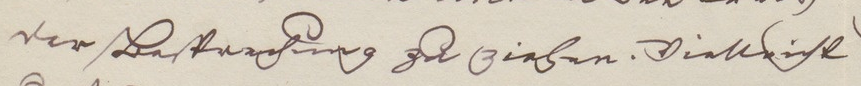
der Besprechung zu ziehen. Vielleicht
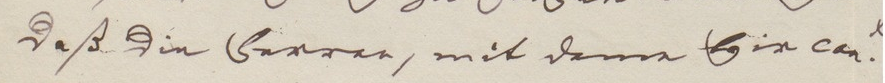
daß die Herren, mit denen wir con-
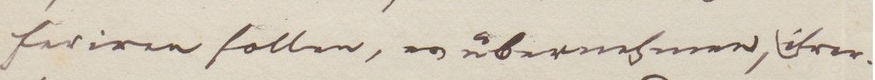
feriren sollen, es übernehmen, ihrer-
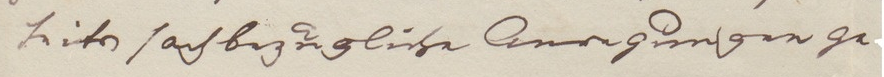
seits sachbezügliche Anregungen ge-
